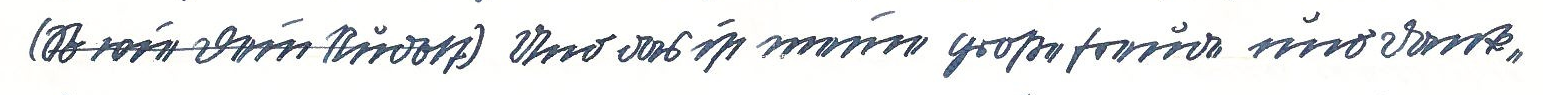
(So wie Dein) Und das ist meine große Freude und Dank¬
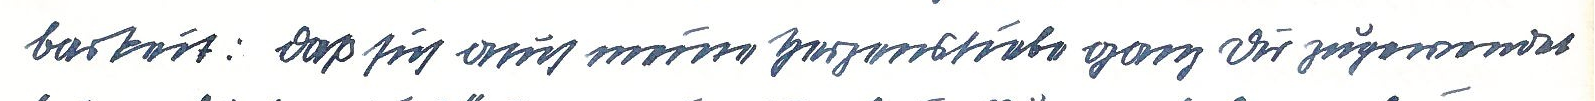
barkeit: Daß sich auch meine Herzensliebe ganz Dir zugewendet
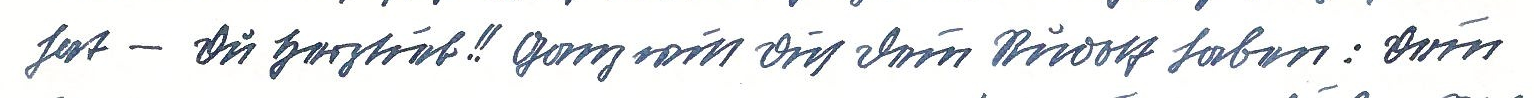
hat — Du Herzlieb!! Ganz will Dich Dein haben: Dein
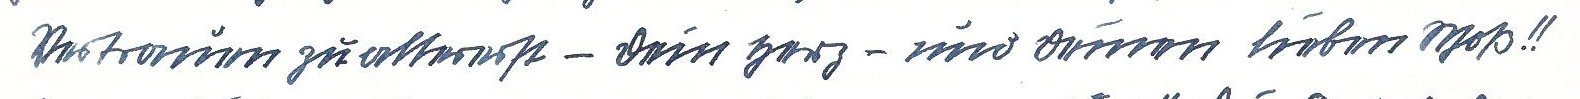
Vertrauen zu allererst — Dein Herz – und Deinen lieben Schoß!!
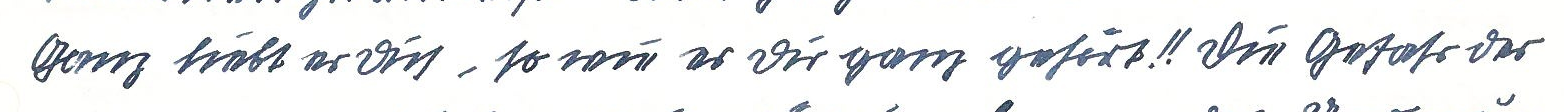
Ganz liebt er Dich, so wie er Dir ganz gehört!! Die Gefahr der
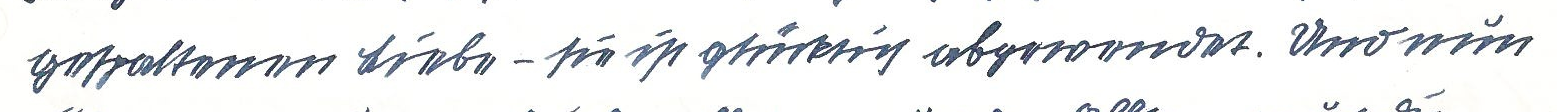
gespaltenen Liebe – sie ist glücklich abgewendet. Und nun
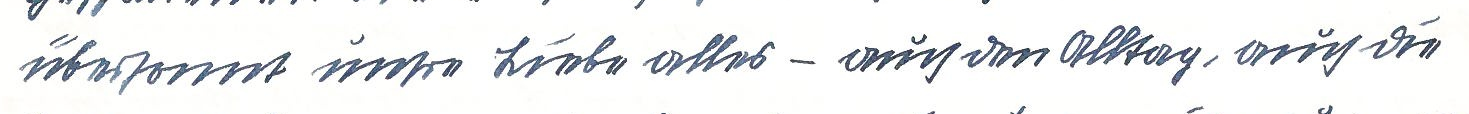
übersonnt unsre Liebe alles – auch den Alltag, auch die
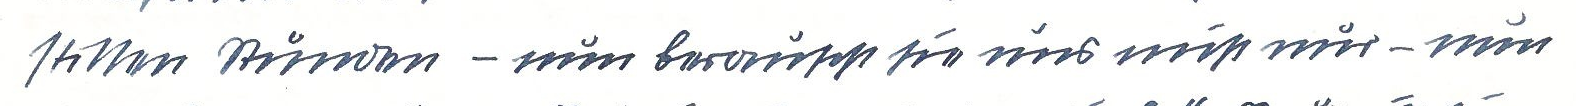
stillen Stunden – nun berauscht sie uns nicht nur – nun
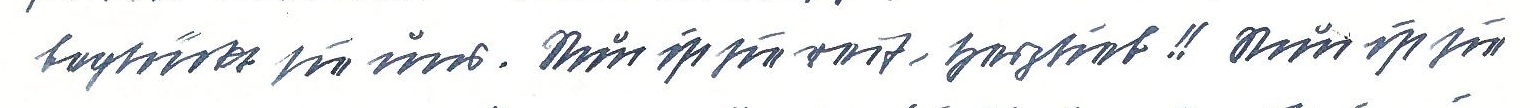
beglückt sie uns. Nun ist sie reif, Herzlieb!! Nun ist sie
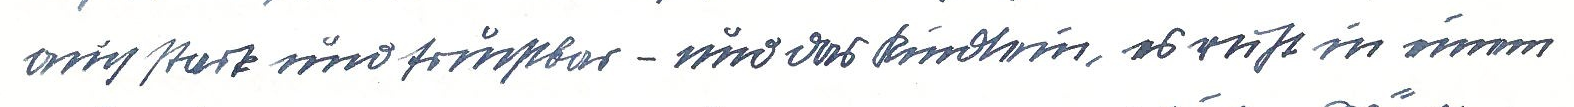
auch stark und fruchtbar – und das Kindlein, es ruht in einem
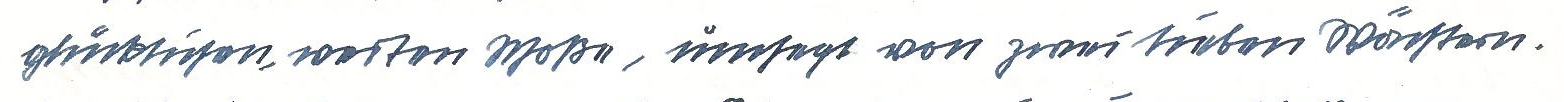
glücklichen, werten Schoße, umhegt von zwei lieben Wächtern.
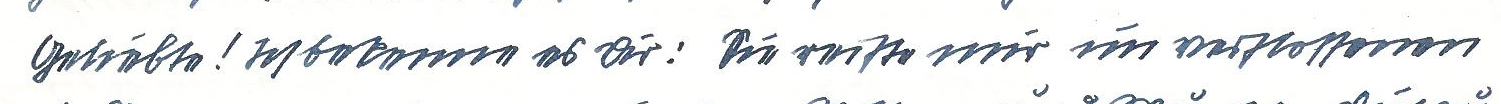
Geliebte! Ich bekenne es Dir: Sie reifte mir im verflossenen
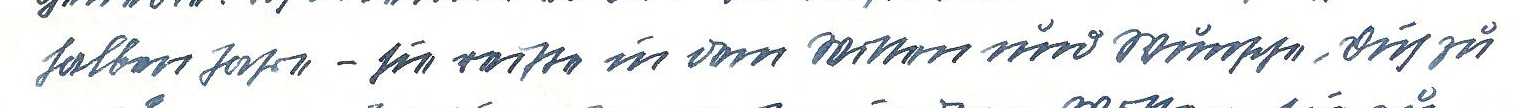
halben Jahre – sie reifte in dem Willen und Wunsche, Dich zu
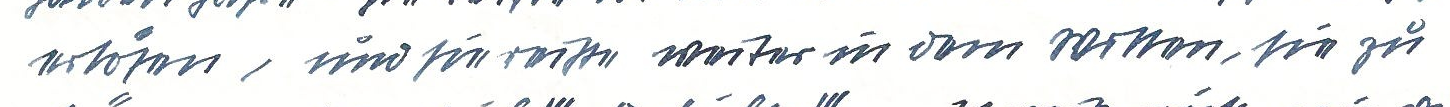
erlösen, und sie reifte weiter in dem Willen, sie zu
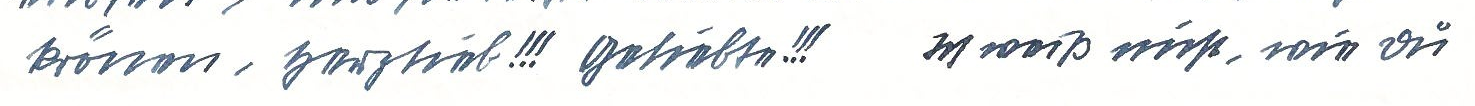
krönen, Herzlieb!!! Geliebte!!! Ich weiß nicht, wie Du
